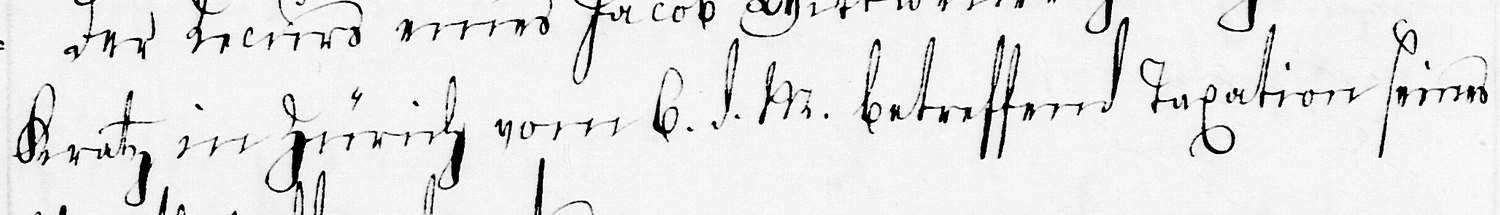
Kratz in Zürich vom 6. d. M. betreffend Taxation seines
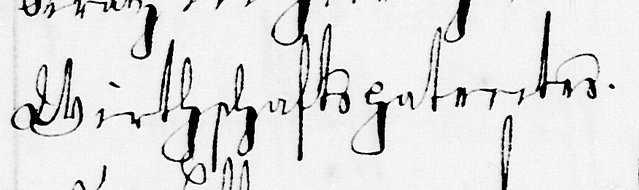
Wirthschaftspatentes.
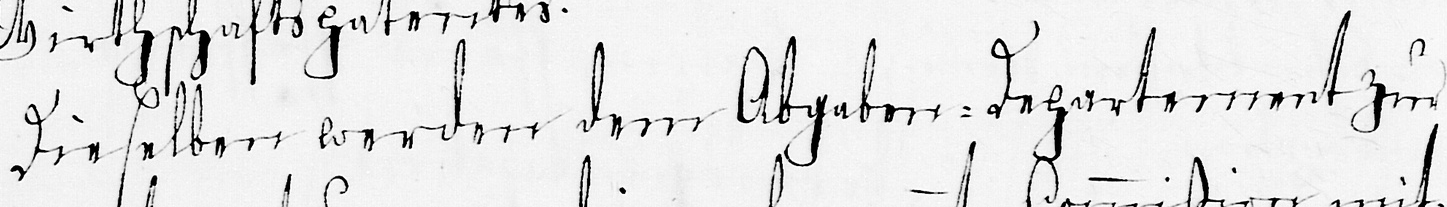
Dieselben werden dem Abgaben-Departement zur
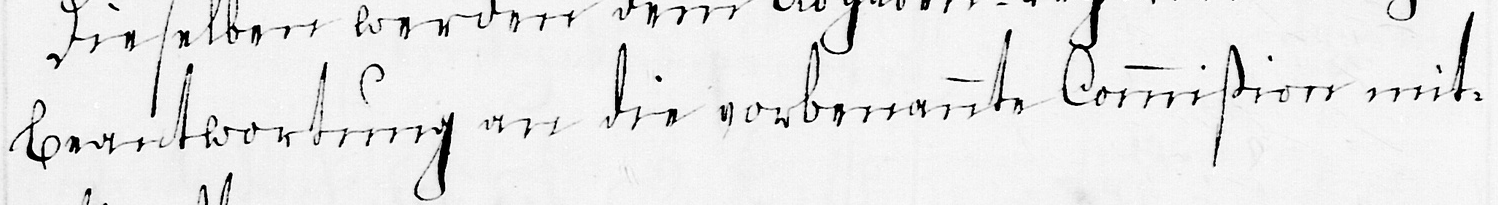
Beantwortung an die vorbenannte Commißion mit¬
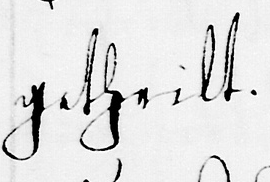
getheilt.
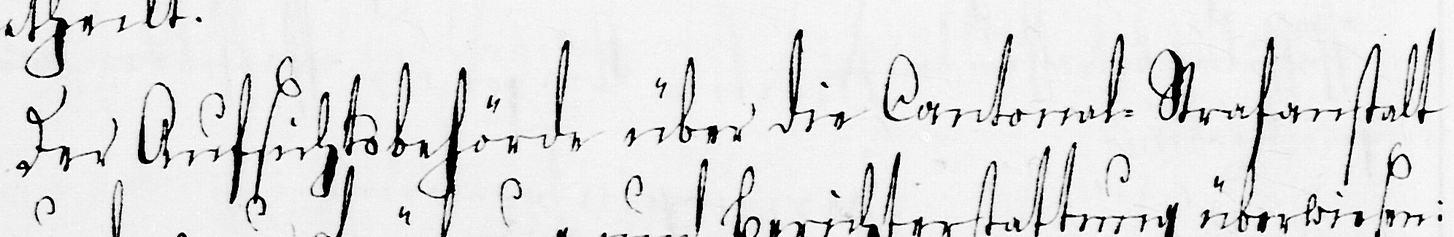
Der Aufsichtsbehörde über die Cantonal-Strafanstalt
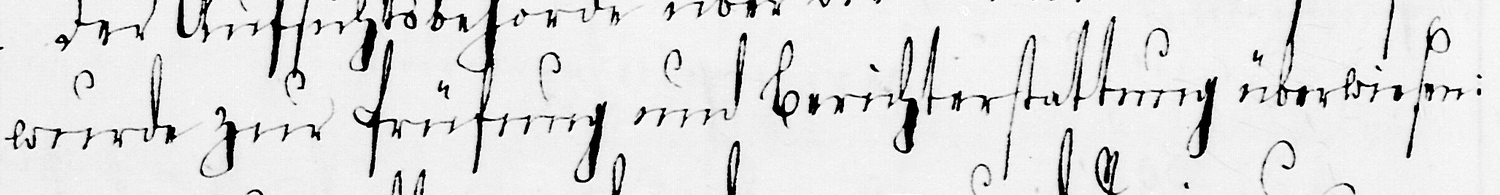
wurde zur Prüfung und Berichterstattung überwiesen:
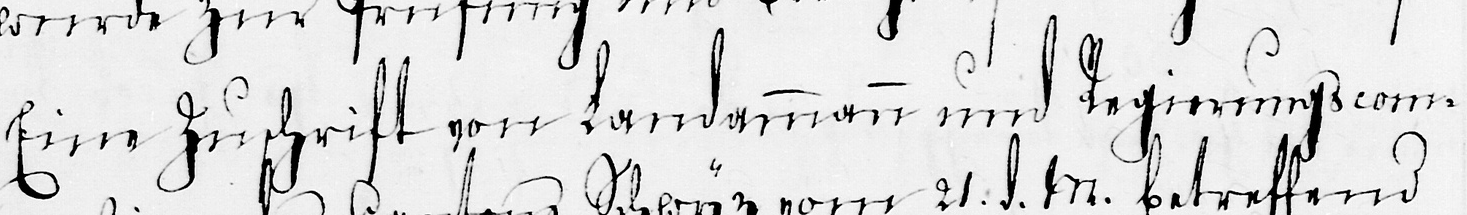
Eine Zuschrift von Landammann und Regierungscom¬
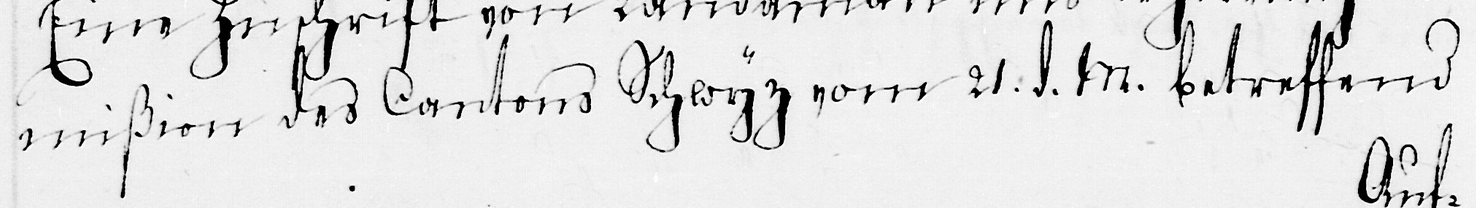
mißion des Cantons Schwyz vom 21. d. M. betreffend
